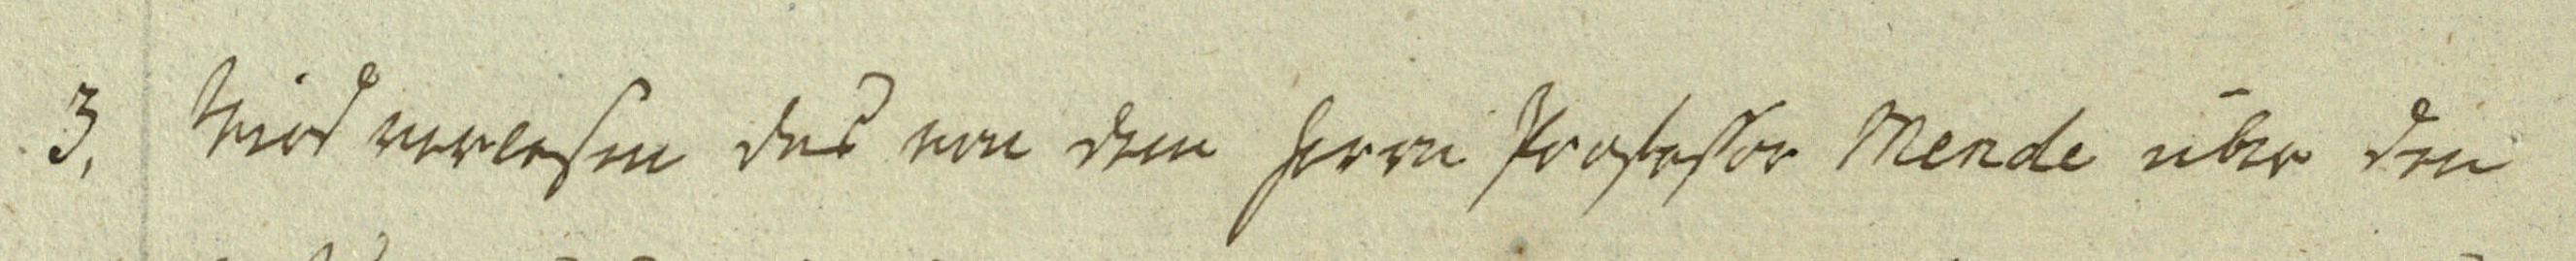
3. Wird verlesen das von dem Herrn Professor Mende über den
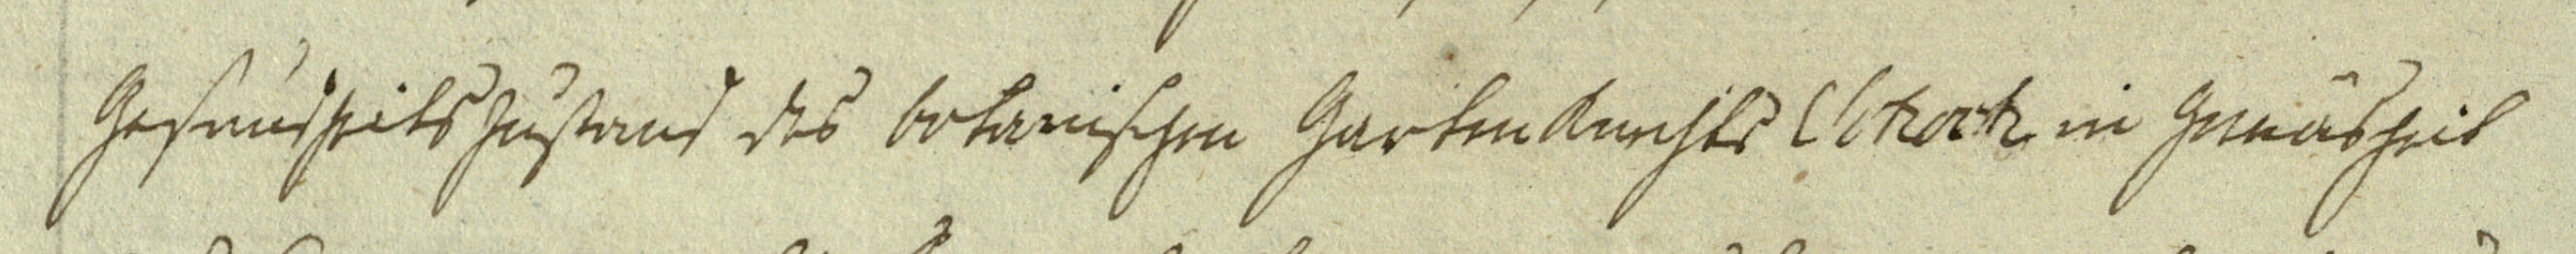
Gesundheitszustand des botanischen Gartenknechts Schoch in Gemäsheit
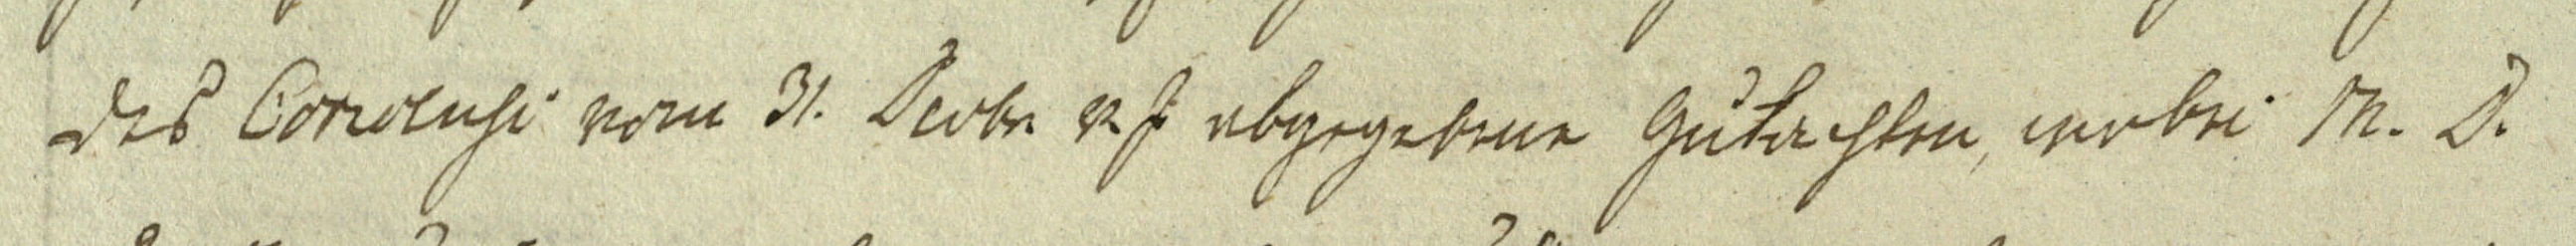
des Conclusi vom 31. Decbr. v. J. abgegebene Gutachten, wobei M. D.
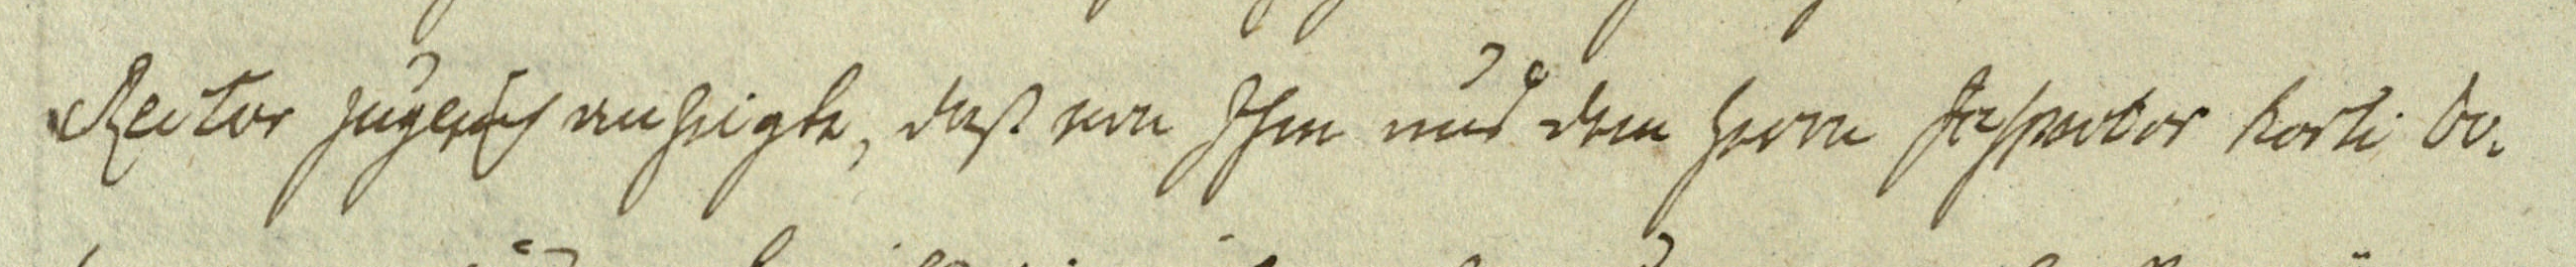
Rector zugleich anzeigte, daß von Ihm und dem Herrn Inspector horti bo¬
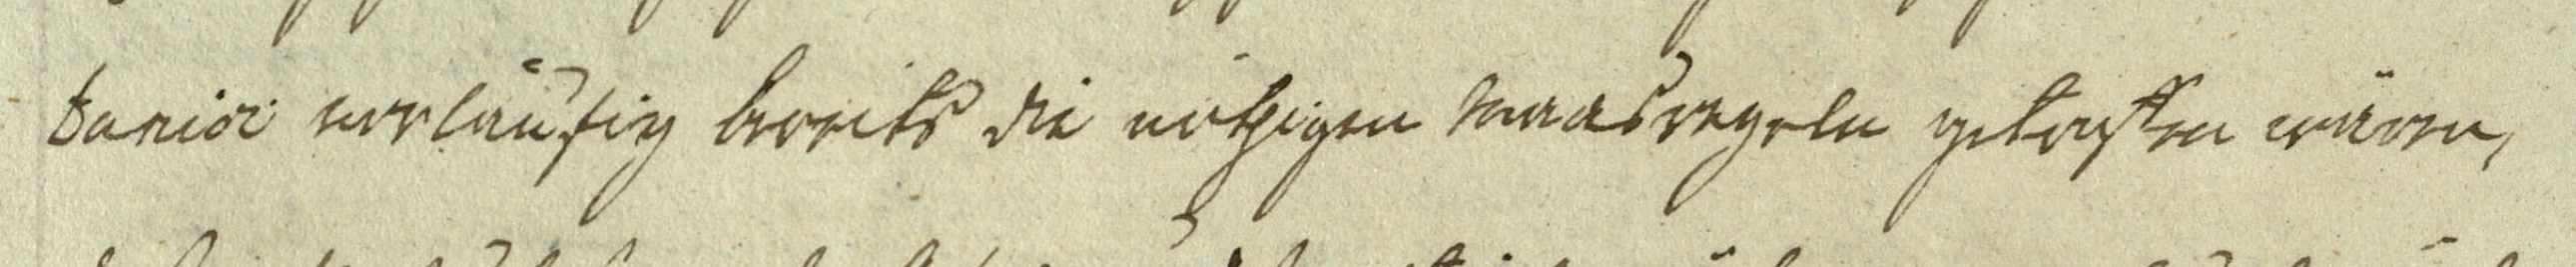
tanici vorläufig bereits die nöthigen Maasregeln getroffen wären,
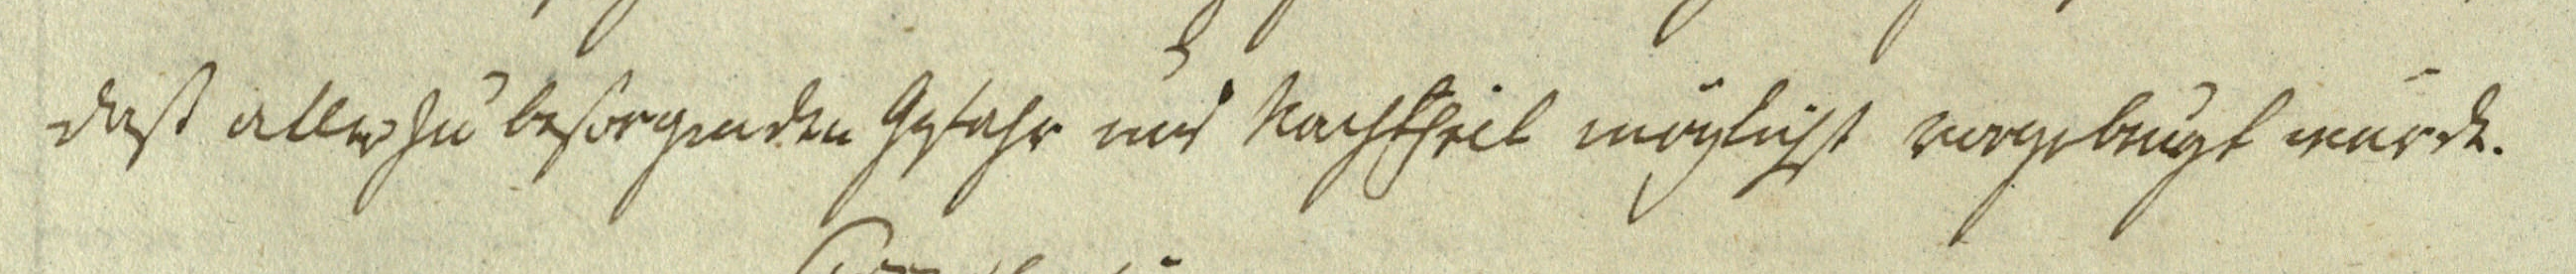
daß aller zu besorgenden Gefahr und Nachtheil möglichst vorgebeugt würde.
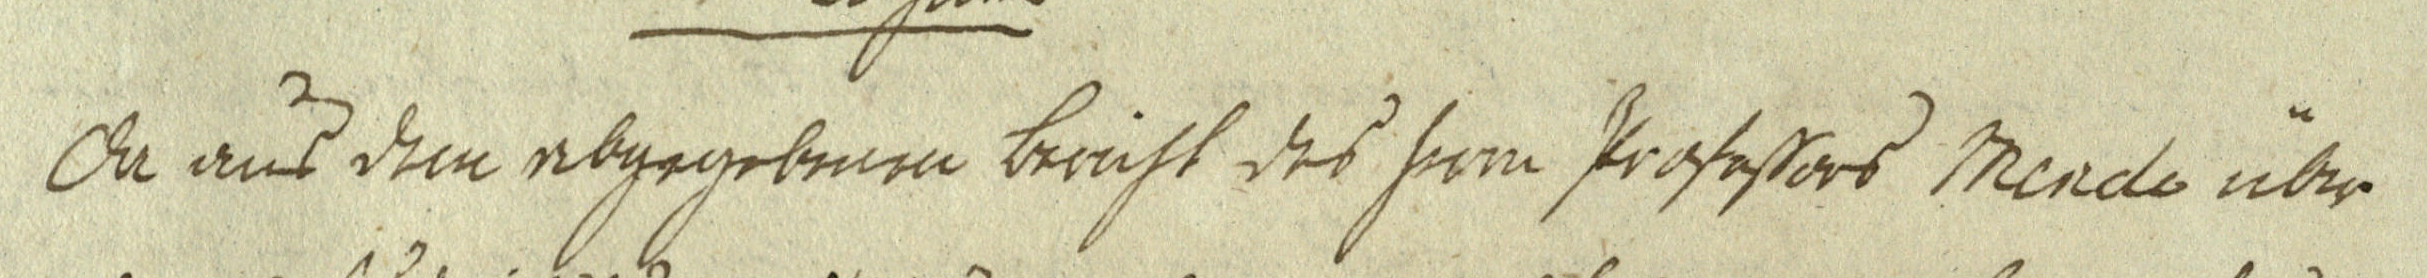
Da aus dem abgegebenen Bericht des Herrn Professors Mende über
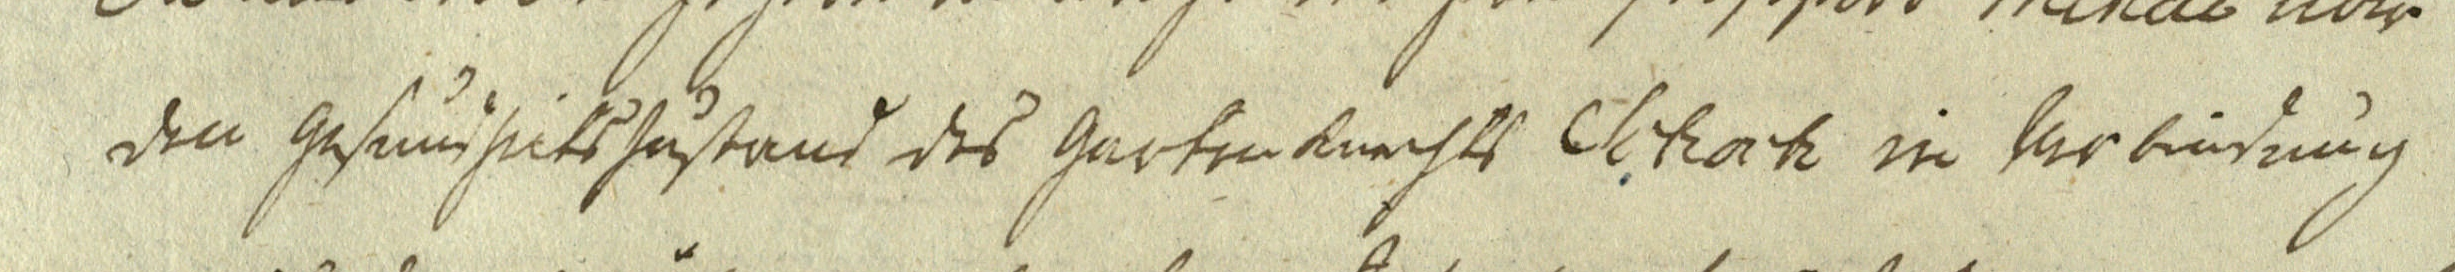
den Gesundheitszustand des Gartenknechts Schoch in Verbindung
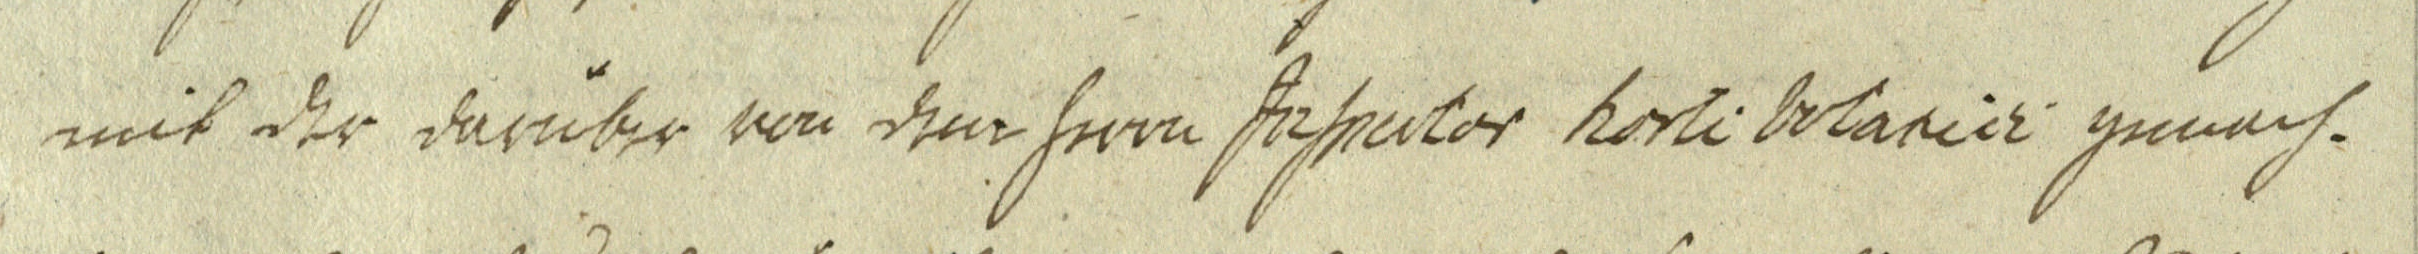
mit der darüber von dem Herrn Inspector horti botanici gemach¬
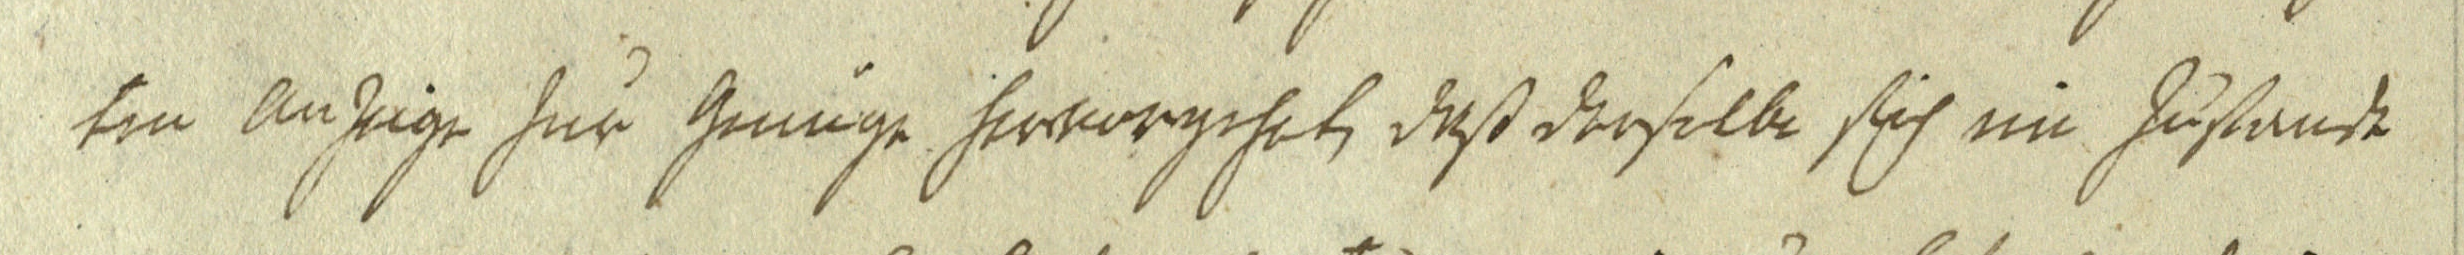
ten Anzeige zur Genüge hervorgehet, daß derselbe sich im Zustande
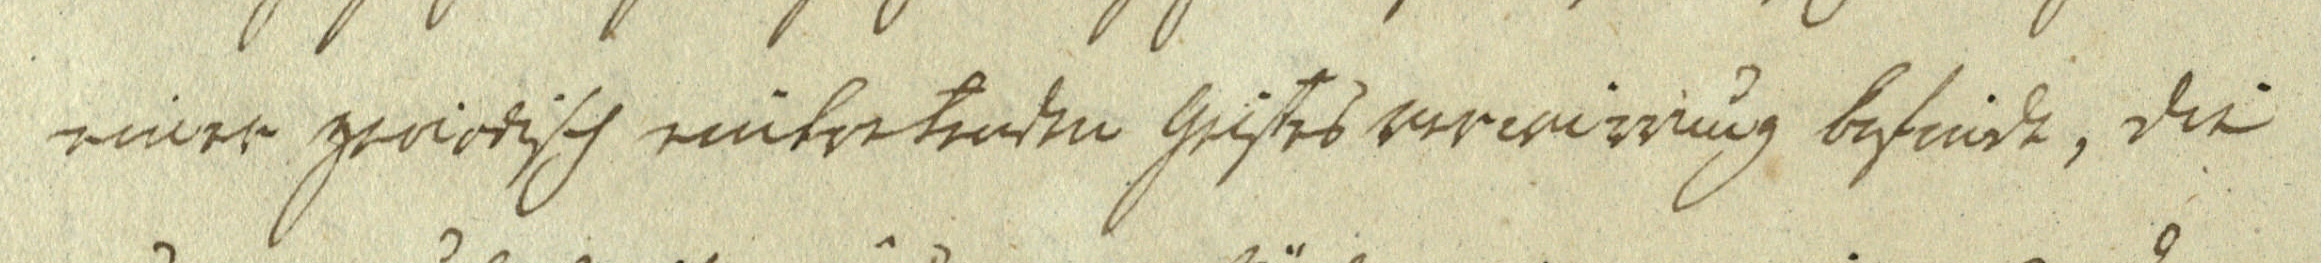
einer periodisch eintretenden Geistesverwirrung befinde, die
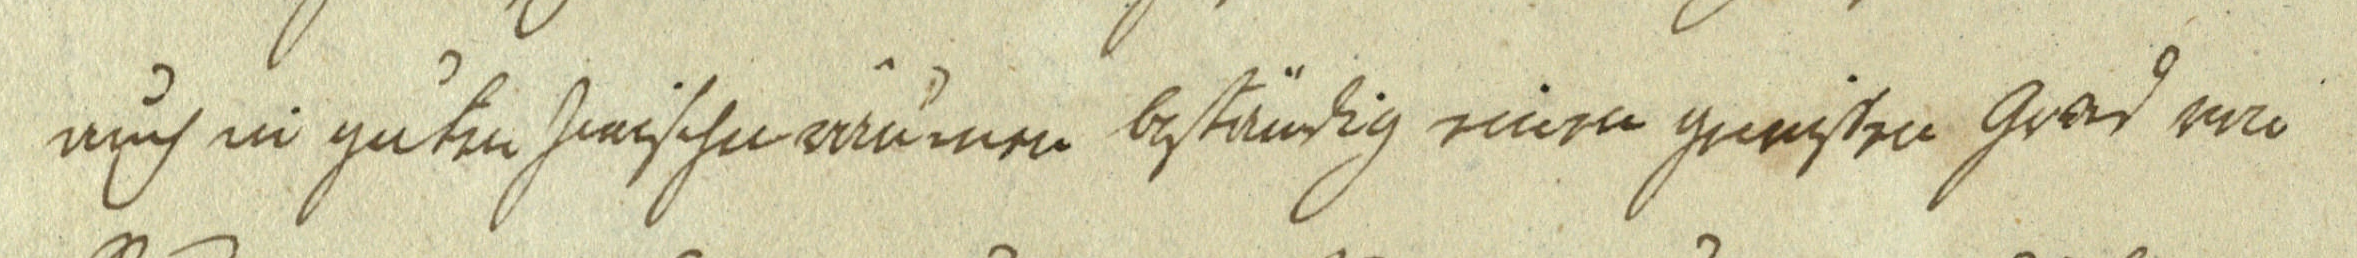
auch in guten Zwischenräumen beständig einen gewissen Grad von
